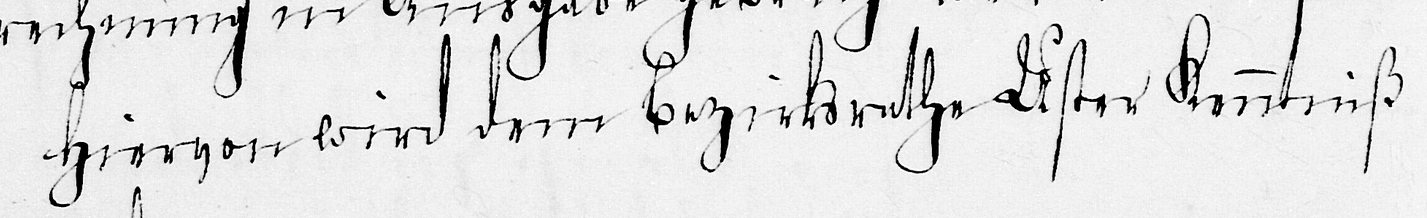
Hiervon wird dem Bezirksrathe Uster Kenntniß
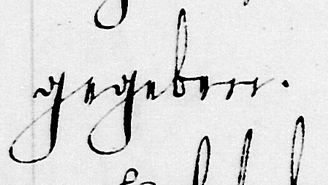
gegeben.
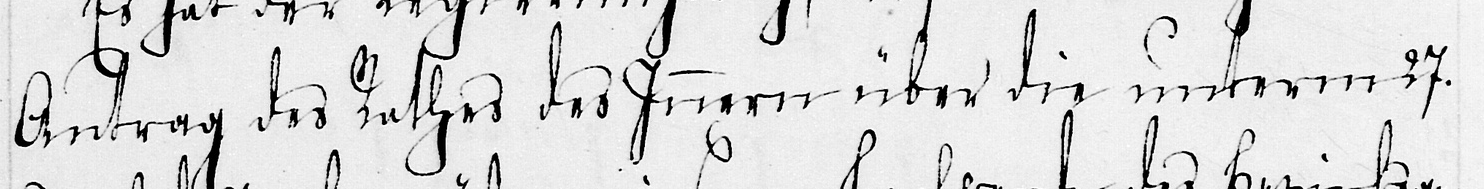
Antrag des Rathes des Innern über die unterm 27.
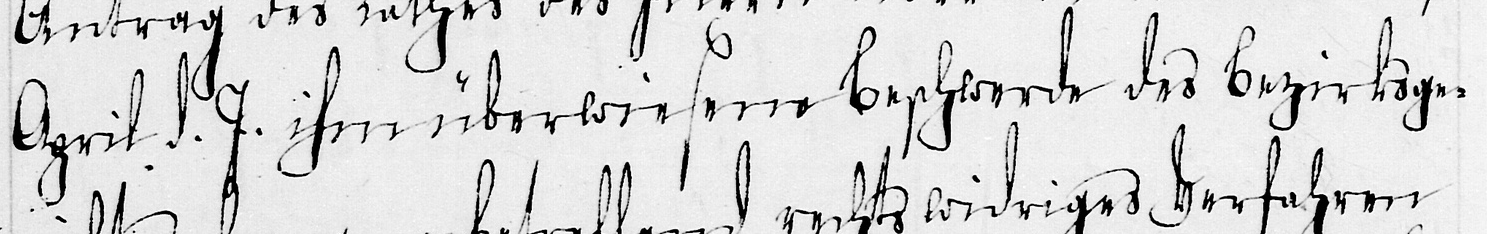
April d. J. ihm überwiesene Beschwerde des Bezirksge¬
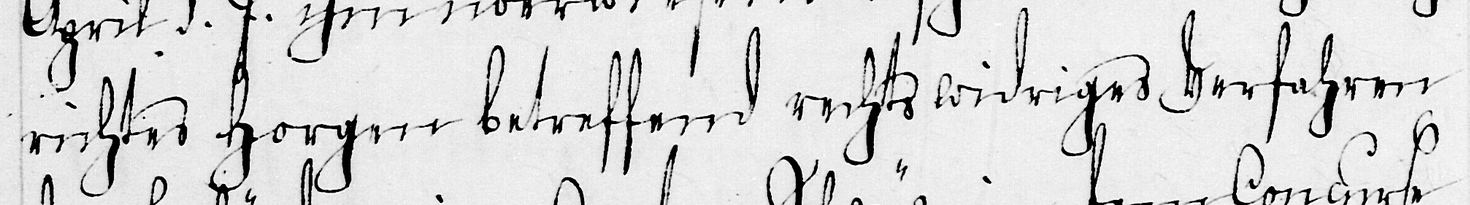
richtes Horgen betreffend rechtwidriges Verfahren
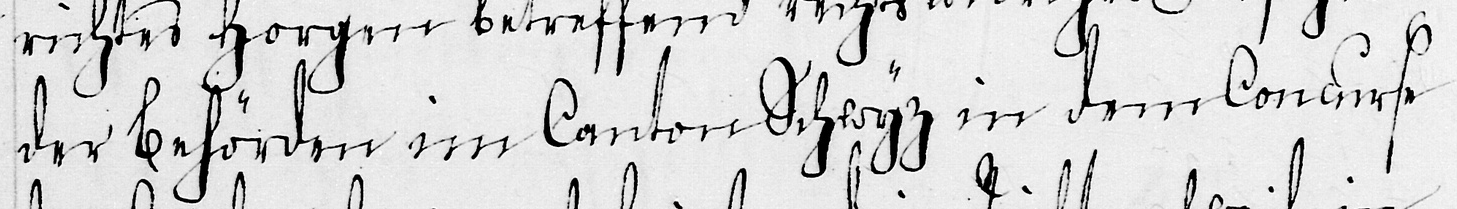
der Behörden im Canton Schwyz in dem Concurse
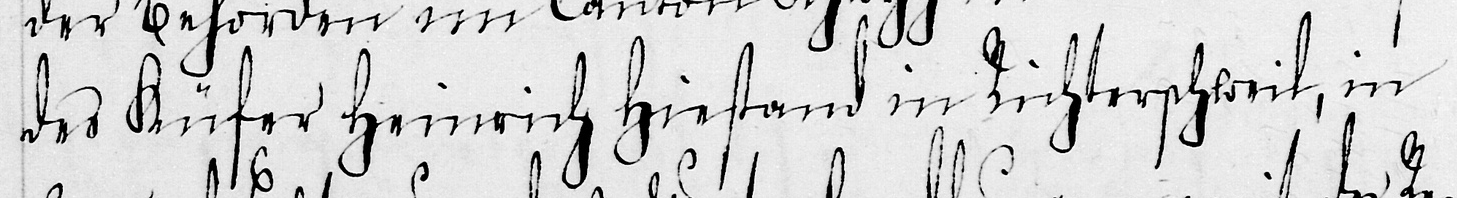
des Küfer Heinrich Hiestand in Richterschweil, in
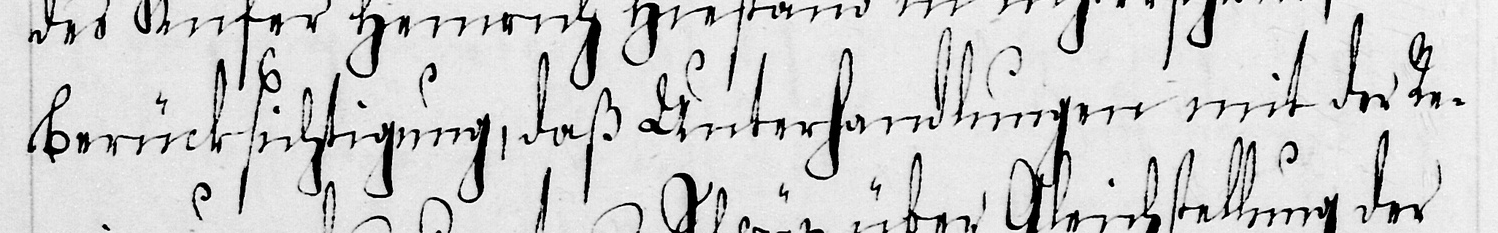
Berücksichtigung, daß Unterhandlungen mit der Re¬
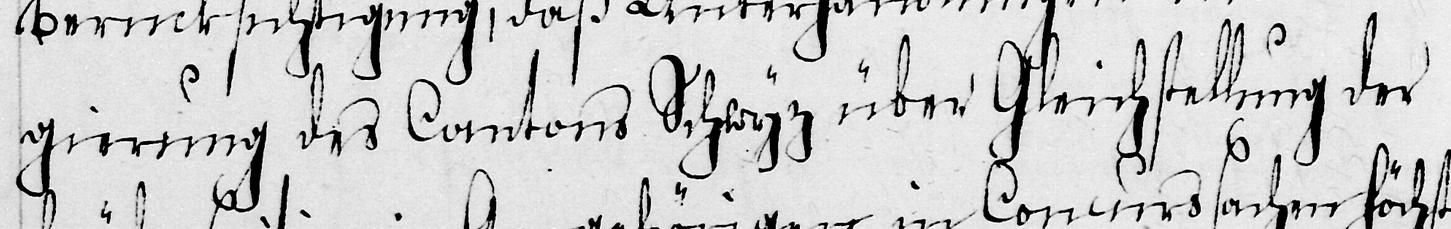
gierung des Cantons Schwyz über Gleichstellung der
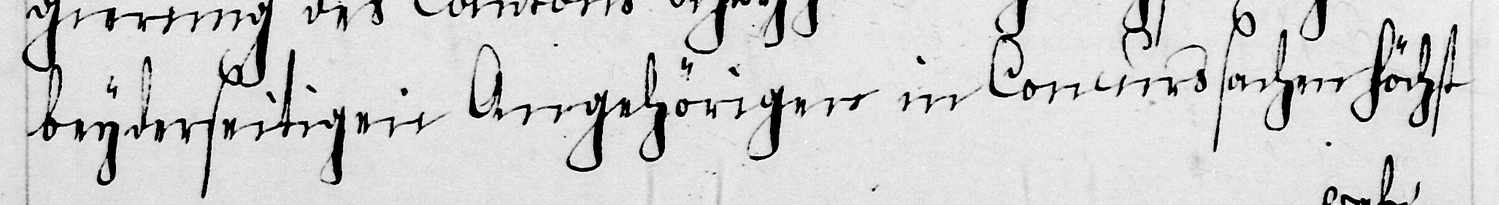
beyderseitigen Angehörigen in Concurssachen höchst
